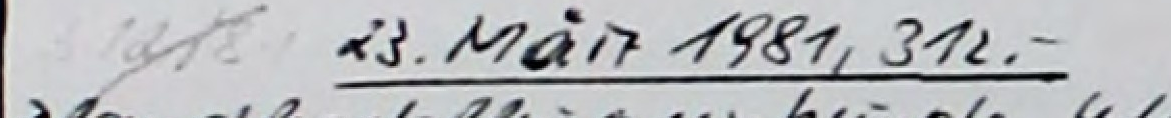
312/81 23. März 1981, 312.-
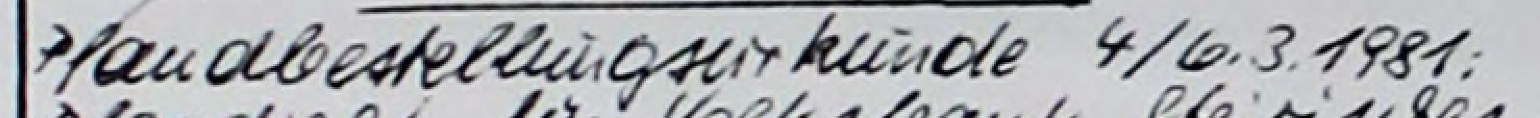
Pfandbestellungsurkunde 4/6.3.1981:
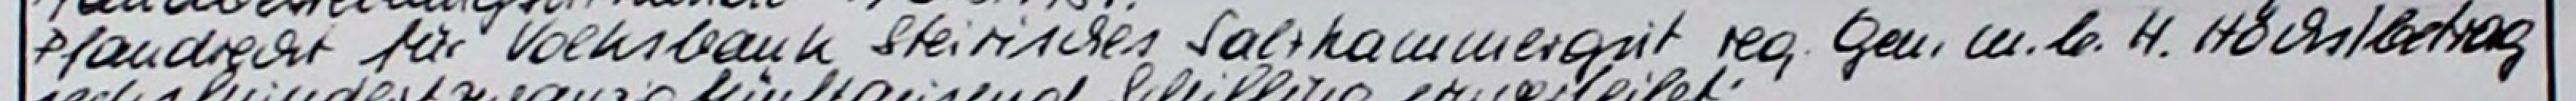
Pfandrecht für Volksbank Steirischer Salzkammergut reg. Gen. m. C. H. Höchstbetrag
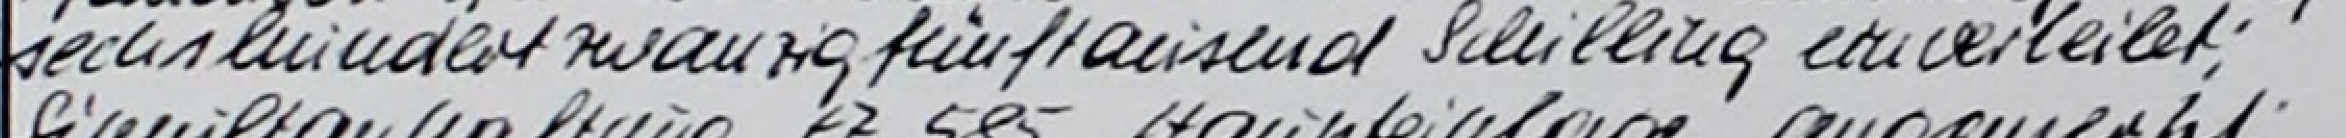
sechs hundert zwanzig fünftausend Schilling einverleibt;
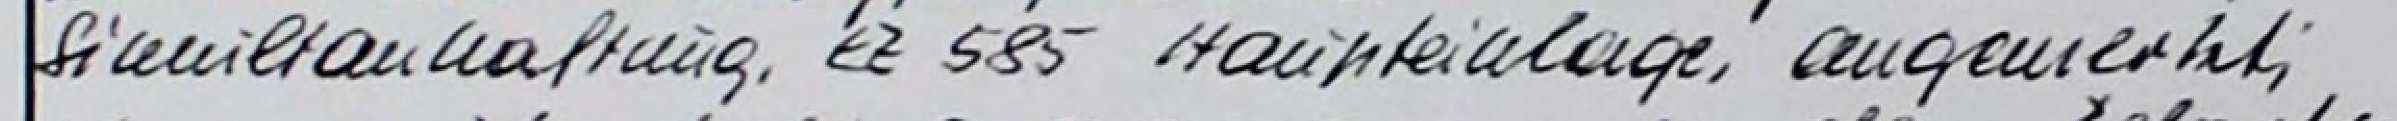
Simultanhaftung, EZ 585 Haupteinlage, angemerkt;
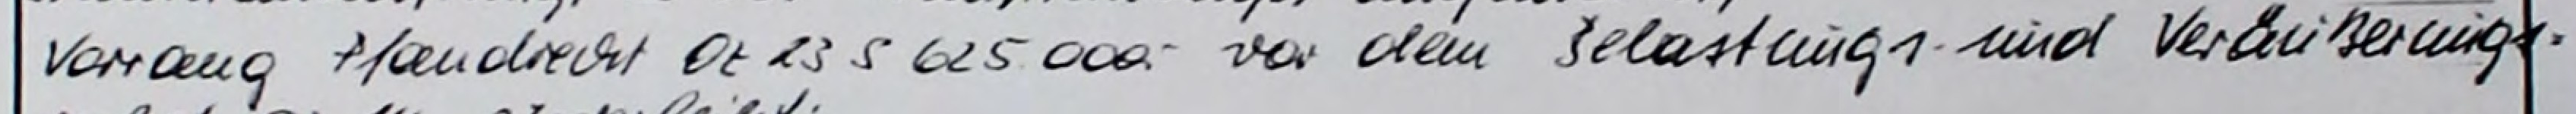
Vorrang Pfandrecht OZ 23 S 625.000 vor dem Belastungs- und Veräußerungs=
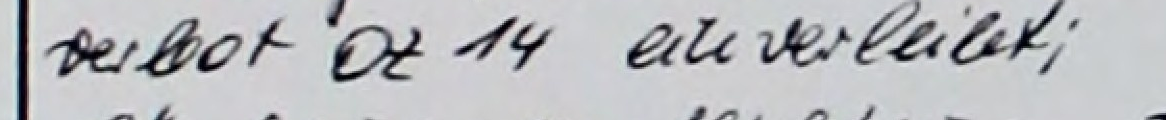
verbot OZ 14 einverleibt;
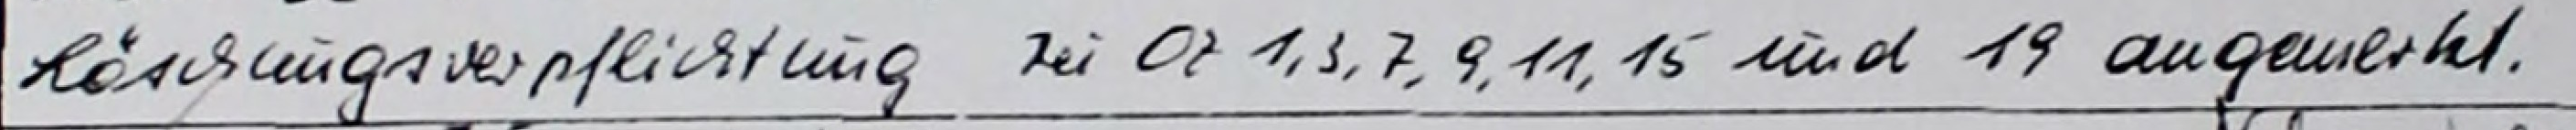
Löschungsverpflichtung zu OZ 1, 3, 7, 9, 11, 15 und 19 angemerkt.
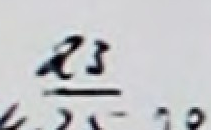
23
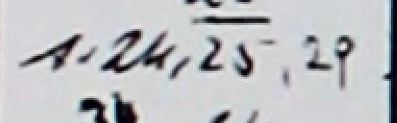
s. 24, 25, 29
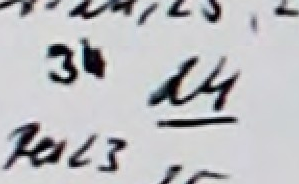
34 24
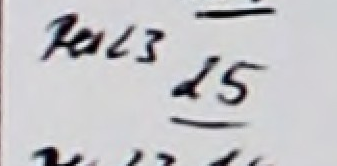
zu 23 25
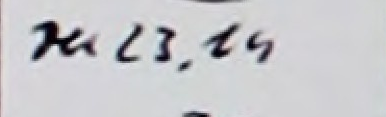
zu 23, 14
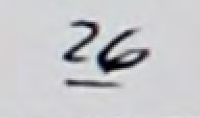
26
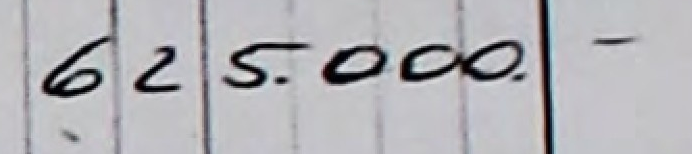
625.000.
